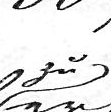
zu
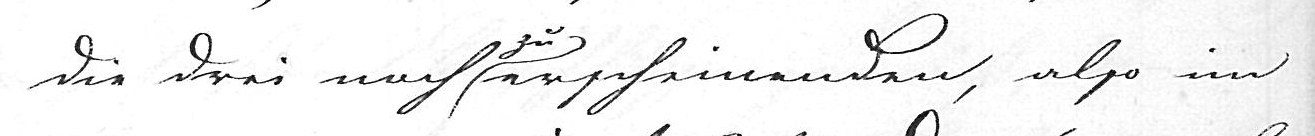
die drei noch erscheinenden, also im
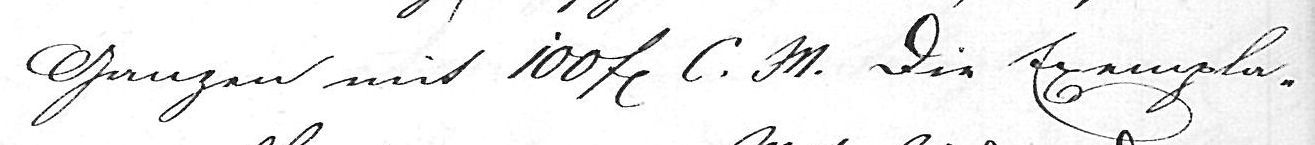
Ganzen mit 100 fl. C. M. Die Exempla-
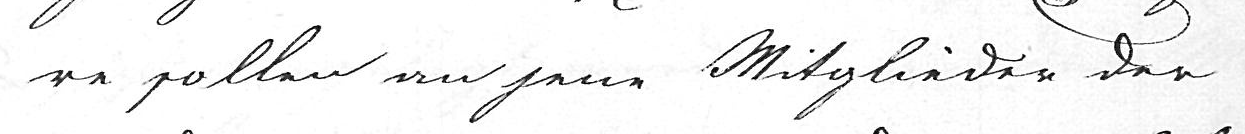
re sollen an jene Mitglieder der
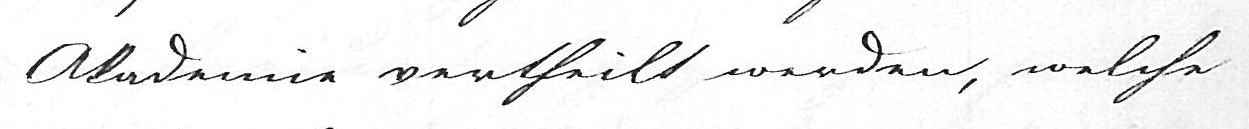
Akademie vertheilt werden, welche
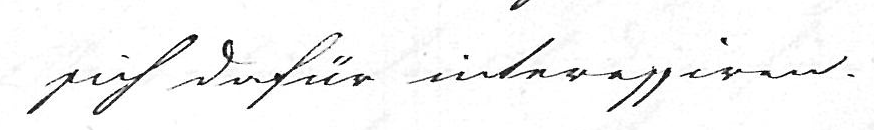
sich dafür interessiren.
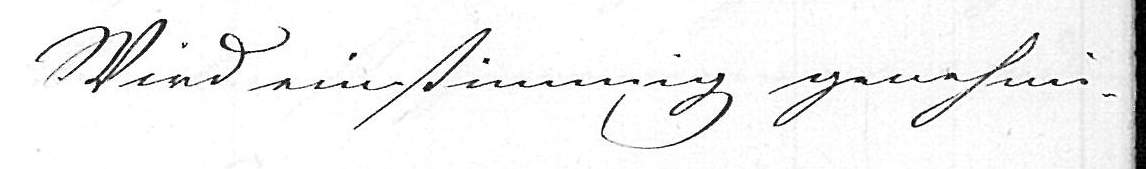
Wird einstimmig genehmi-
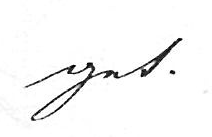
get.
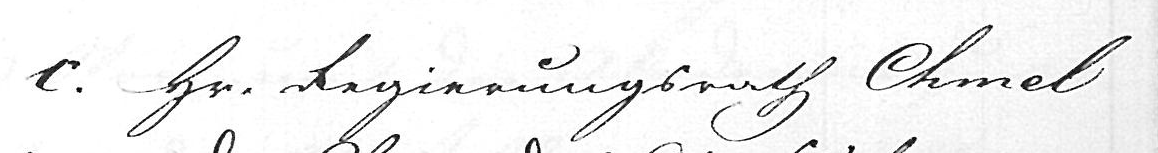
c. Hr. Regierungsrath Chmel
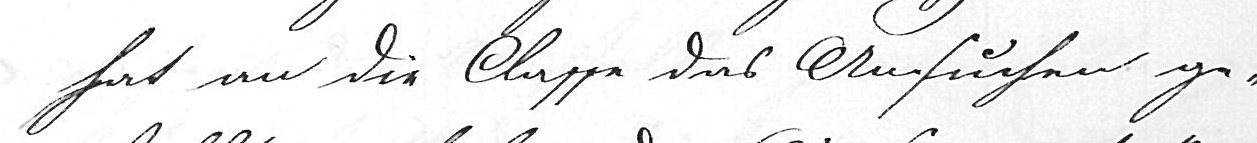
hat an die Classe das Ansuchen ge-
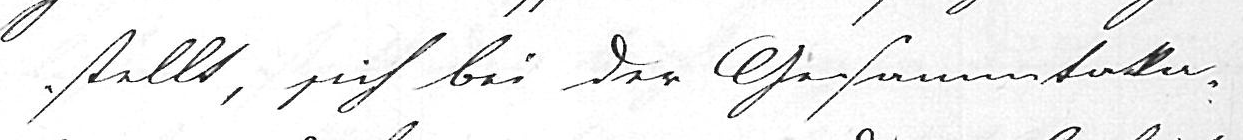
stellt, sich bei der Gesammtaka-
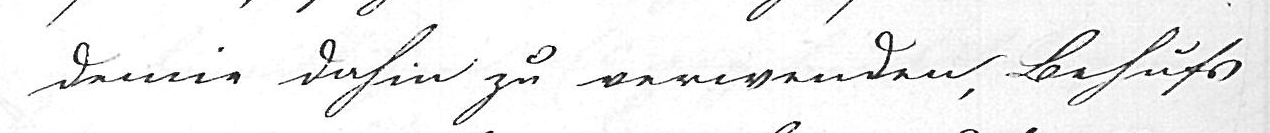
demie dahin zu verwenden, behufs
